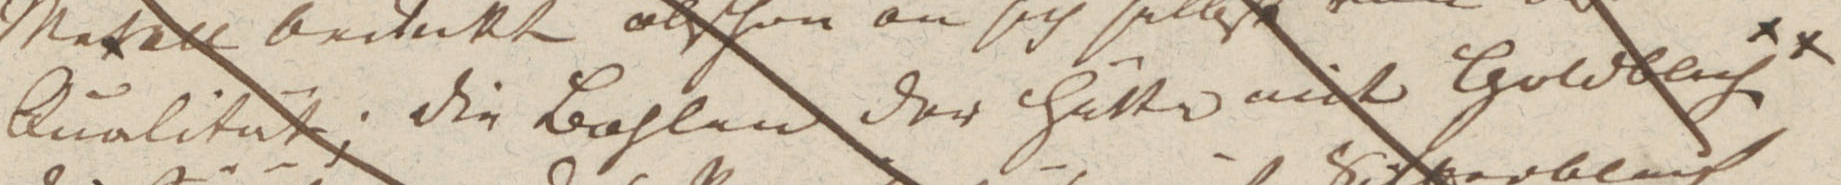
Qualität; Die Bohlen der Hütte mit Goldblech %
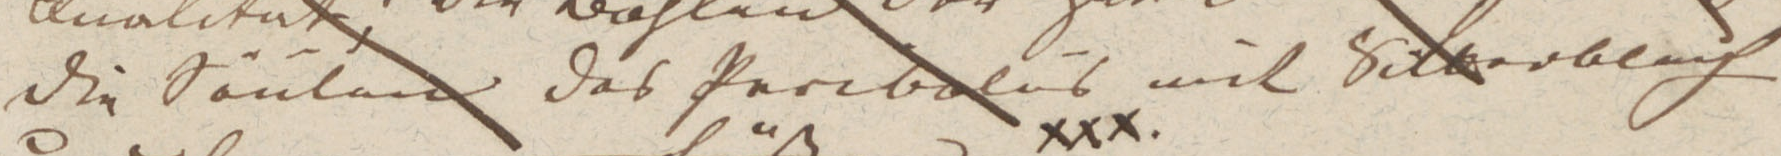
die Säulen des Peribolus mit Silberblech
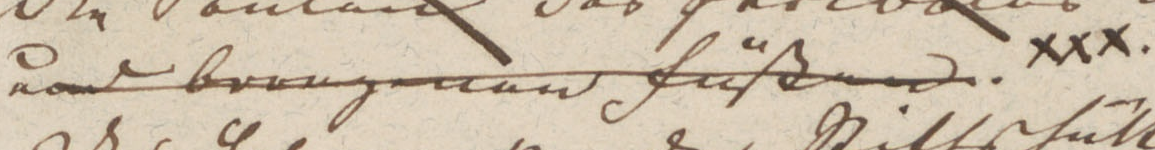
und bronzenen Füssen. %
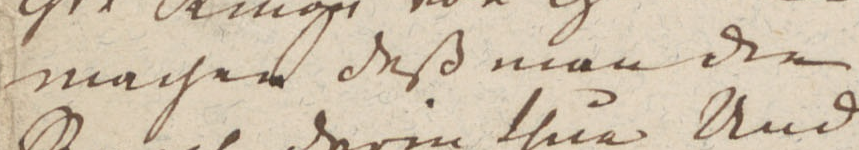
machen dass man die
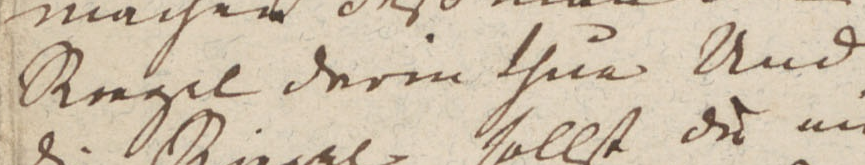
Riegel darin thun Und
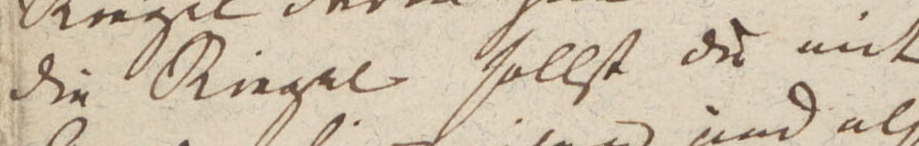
die Riegel sollst du mit
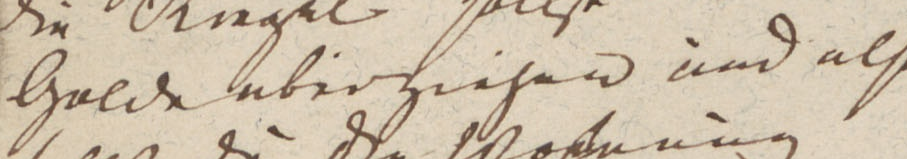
Golde überziehen und also
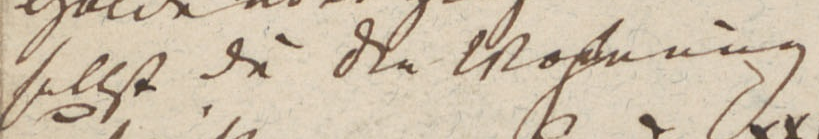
sollst du die Wohnung
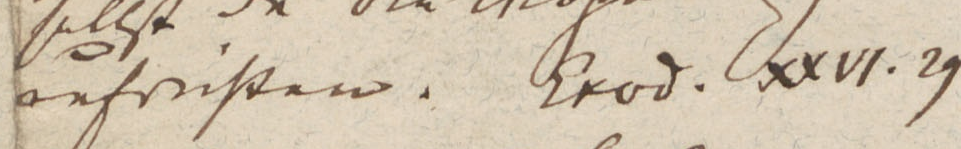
aufrichten. Exod. XXVI. 29.
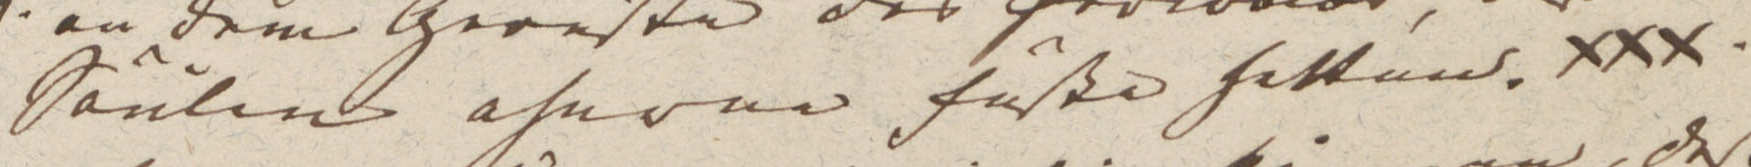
Säulen eherne Füsse hatten. %
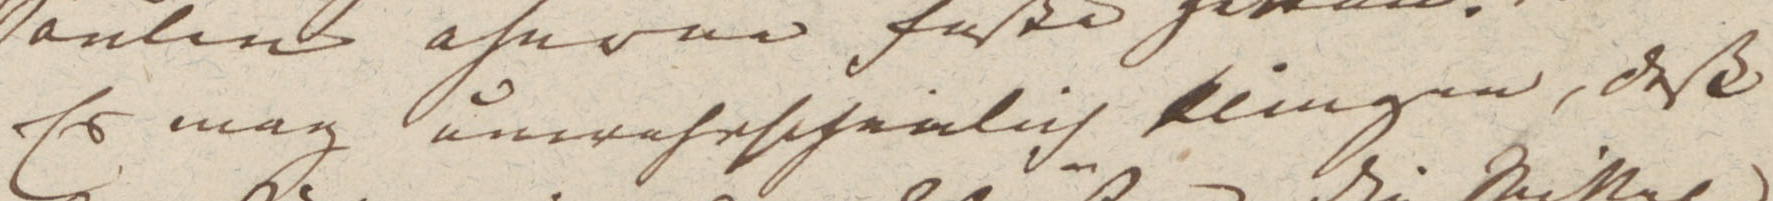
Es mag unwahrscheinlich klingen, dass
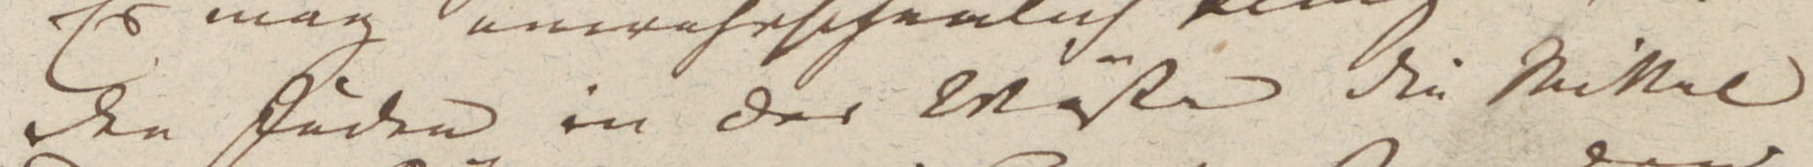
den Juden in der Wüste die Mittel
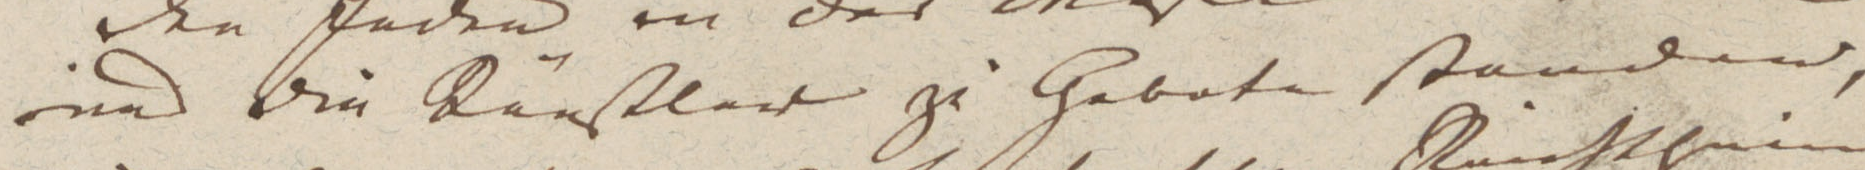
und die Künstler zu Gebote standen,
